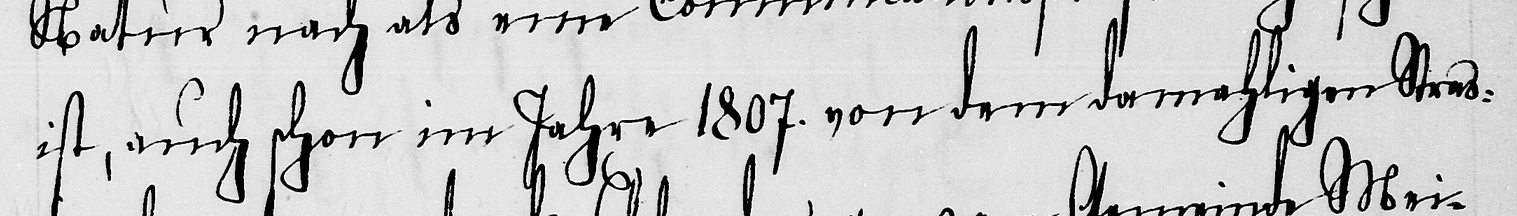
ist, auch schon im Jahre 1807. von dem damahligen Straß¬
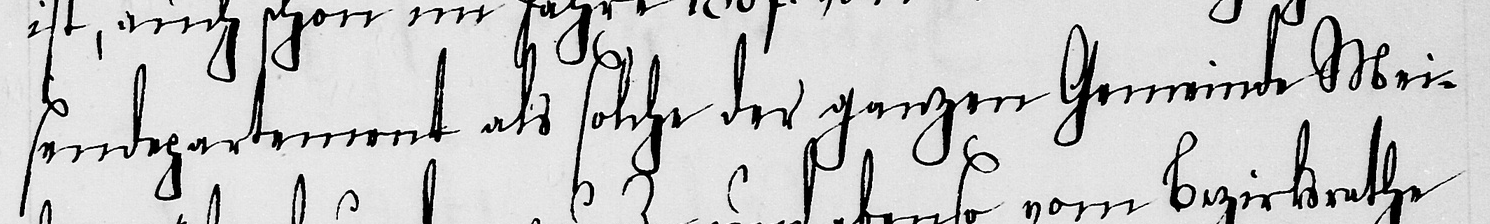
endepartement als solche der ganzen Gemeinde Mei¬
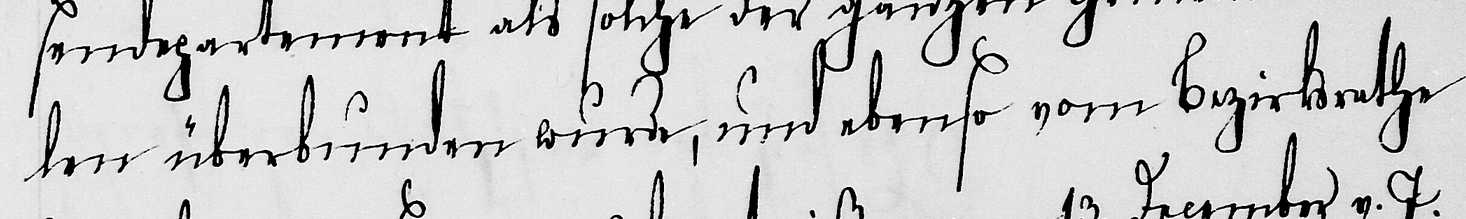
len überbunden wurde, und ebenso vom Bezirksrathe
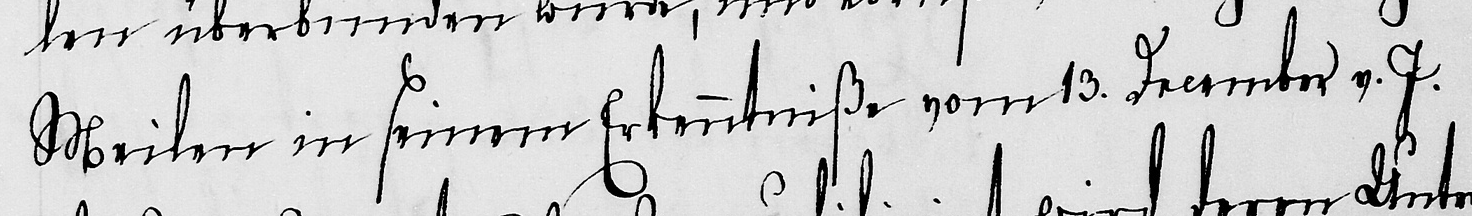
Meilen in seinem Erkenntniße vom 13. December v. J.
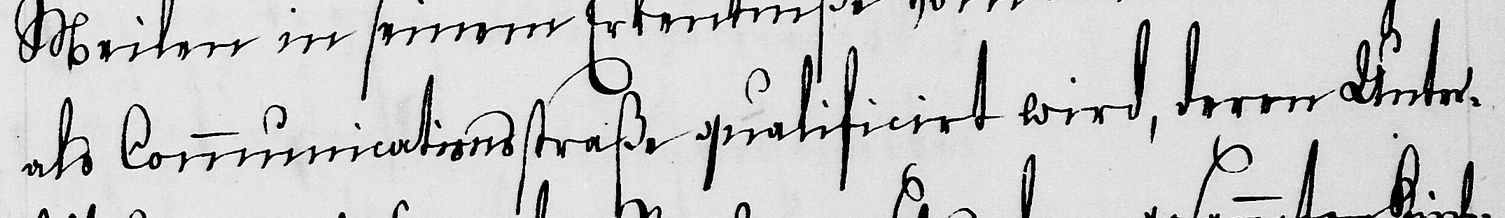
als Communicationsstraße qualificirt wird, deren Unter¬
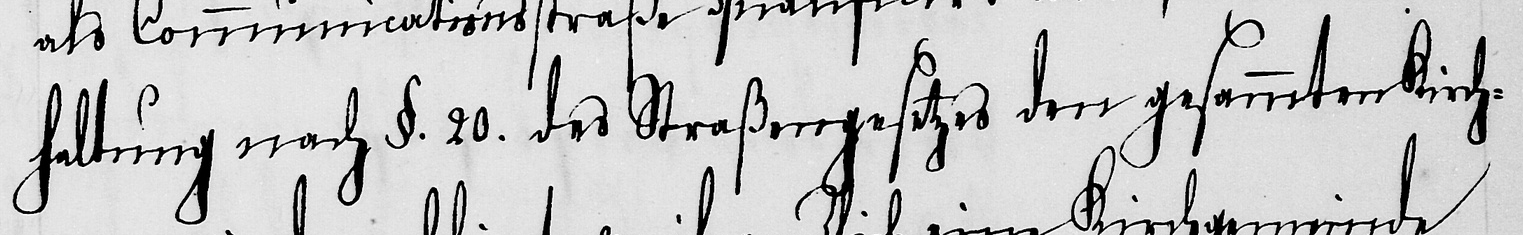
haltung nach §. 20. des Straßengesetzes den gesammten Kirch¬
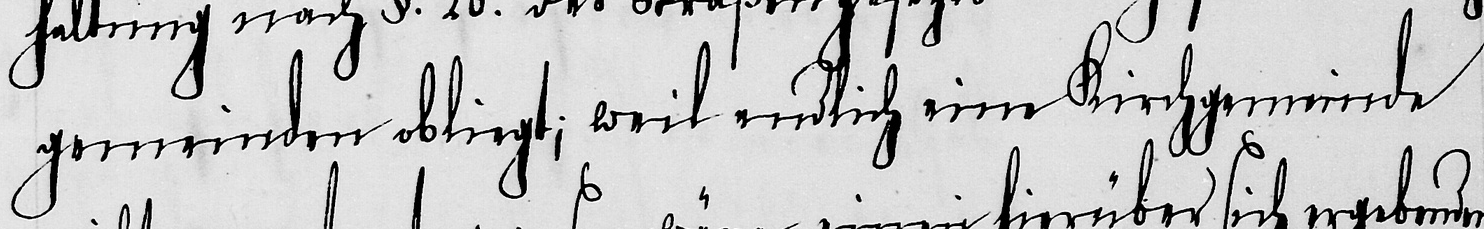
gemeinden obliegt; weil endlich eine Kirchgemeinde
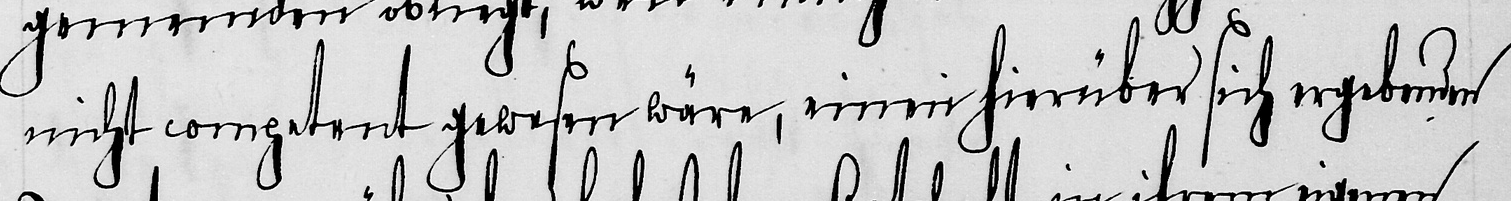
nicht competent gewesen wäre, einen hierüber sich ergebenden
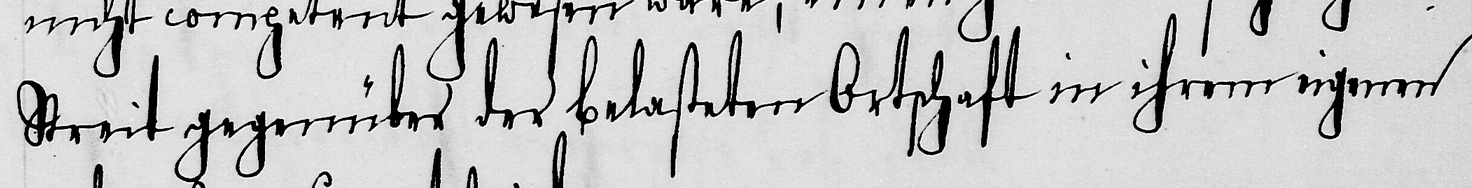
Streit gegenüber der belasteten Ortschaft in ihrem eigenen
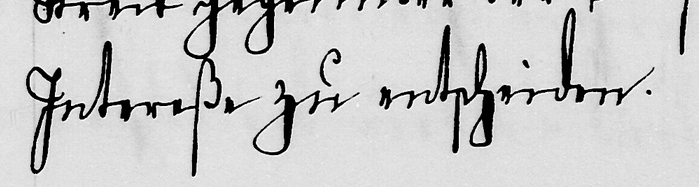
Intereße zu entscheiden.
